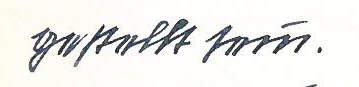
gestellt sein.
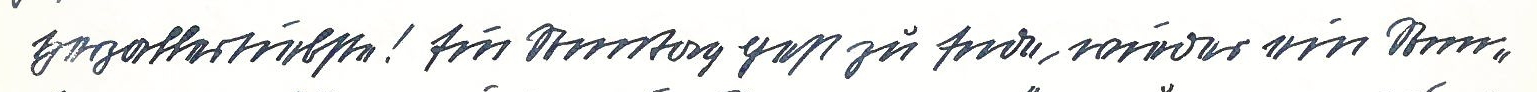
Herzallerliebste! Ein Sonntag geht zu Ende, wieder ein Sonn¬
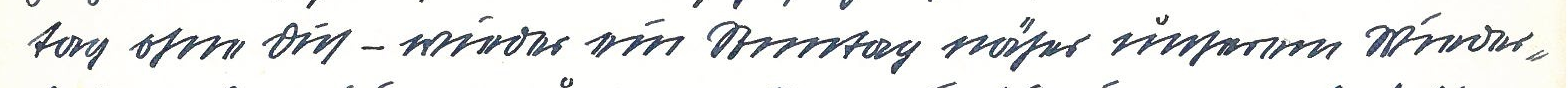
tag ohne Dich – wieder ein Sonntag näher unserem Wieder¬
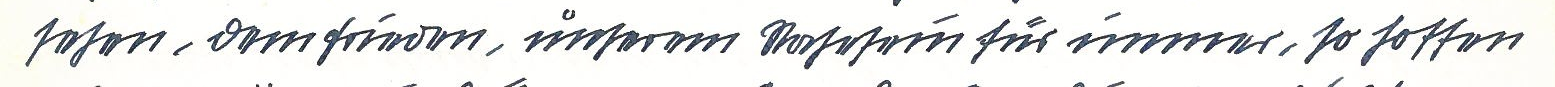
sehen, dem Frieden, unserem Nahesein für immer, so hoffen
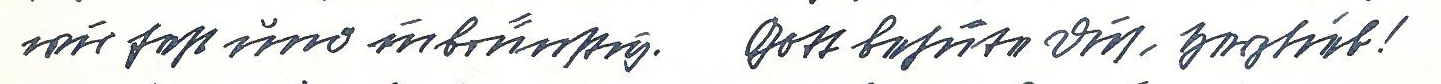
wir fest und inbrünstig. Gott behüte Dich, Herzlieb!
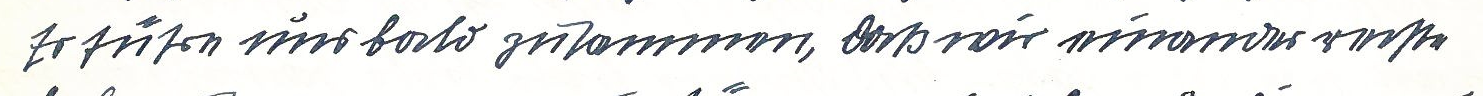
Er führe uns bald zusammen, daß wir einander rechte
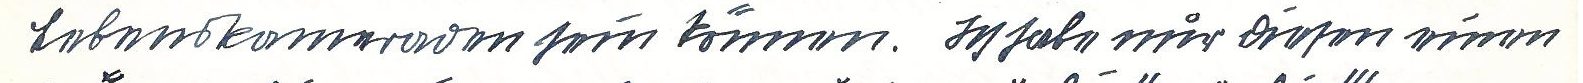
Lebenskameraden sein können. Ich habe nur diesen einen
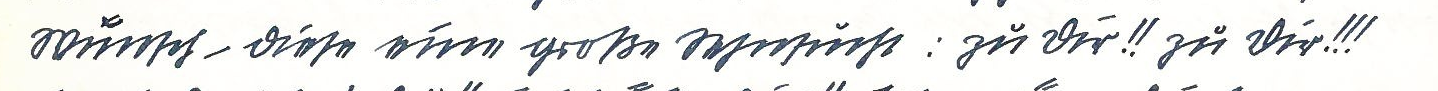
Wunsch, diese eine große Zukunft: zu Dir!! zu Dir!!!
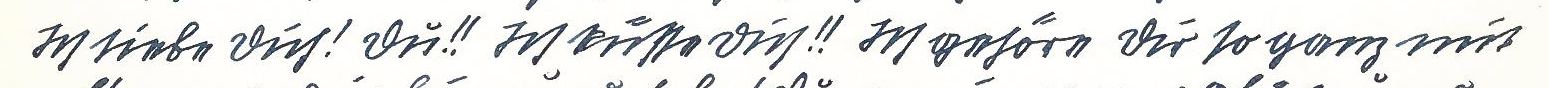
Ich liebe Dich! Du!! Ich küsse Dich!! Ich gehöre Dir so ganz mit
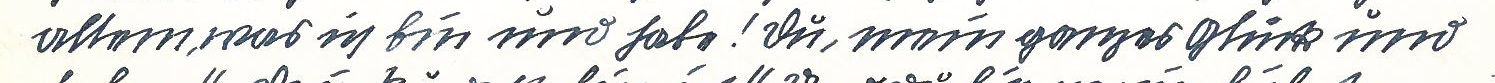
allem, was ich bin und habe! Du, mein ganzes Glück und
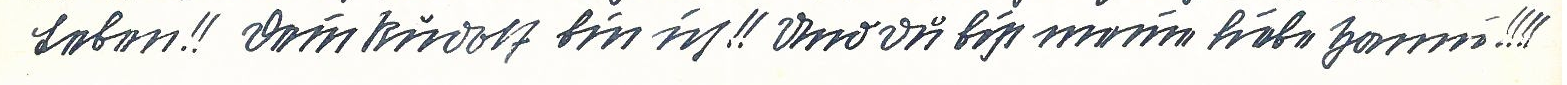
Leben!! Dein bin ich!! Und Du bist meine liebe !!!!
